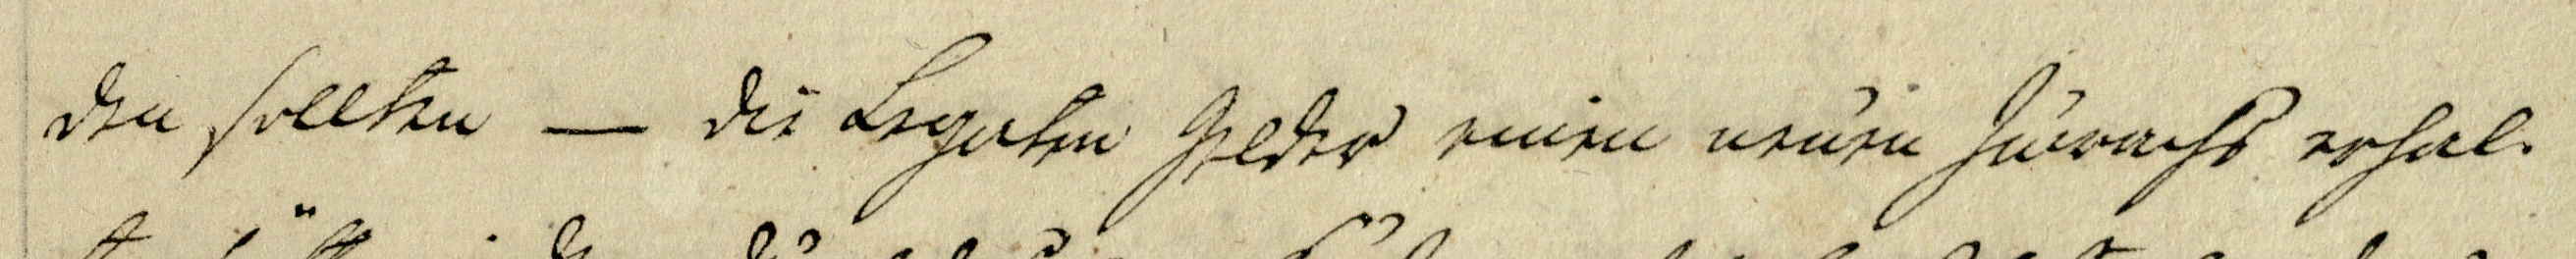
den sollten - die Legaten Gelder einen neuen Zuwachs erhal¬
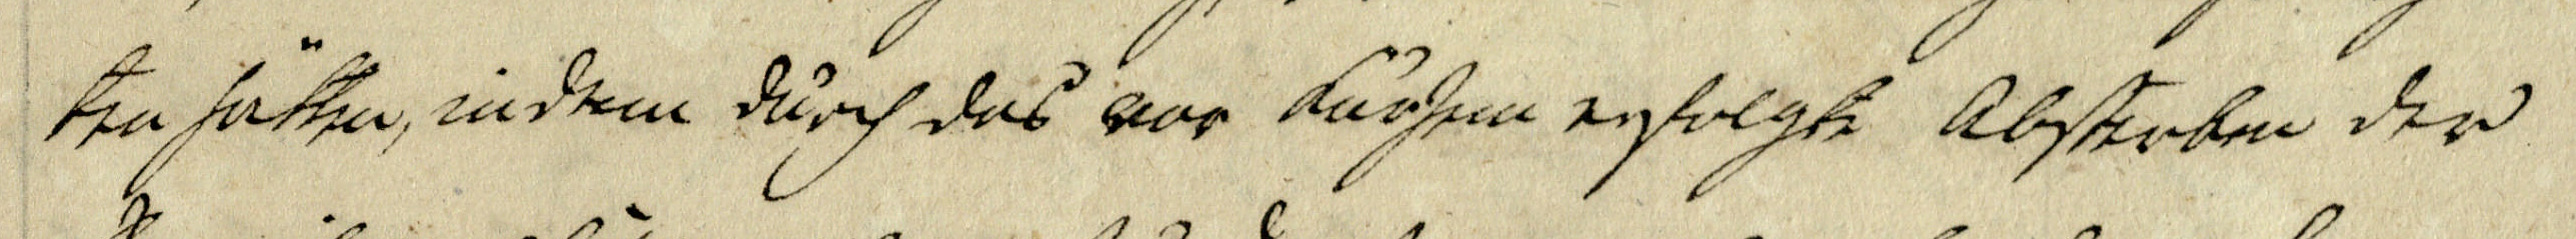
ten hätten, indem durch das vor kurzem erfolgte Absterben der
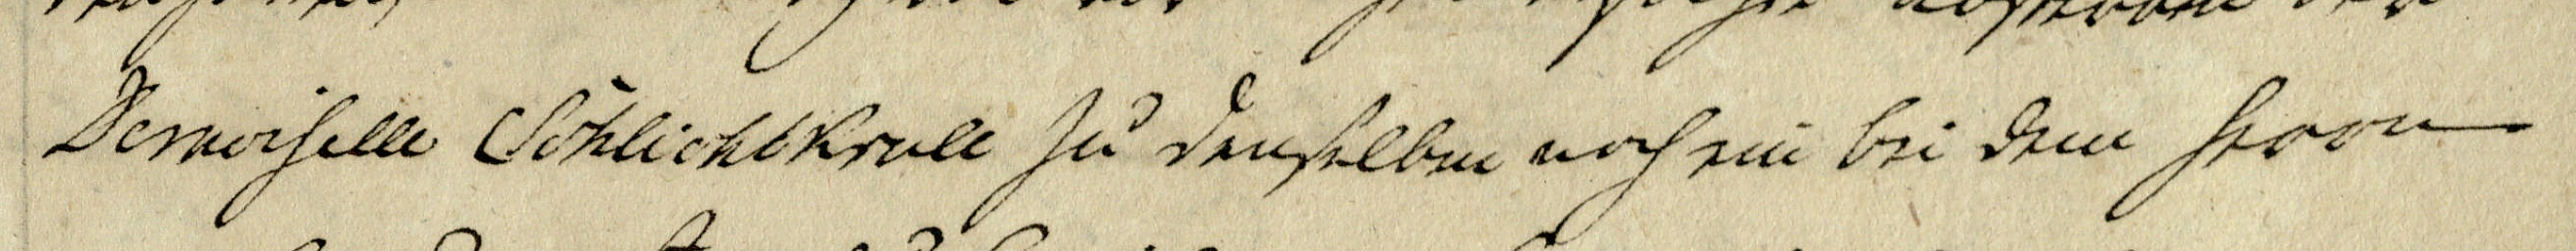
Demoiselle Schlichtkrull zu denselben noch ein bei dem Herrn
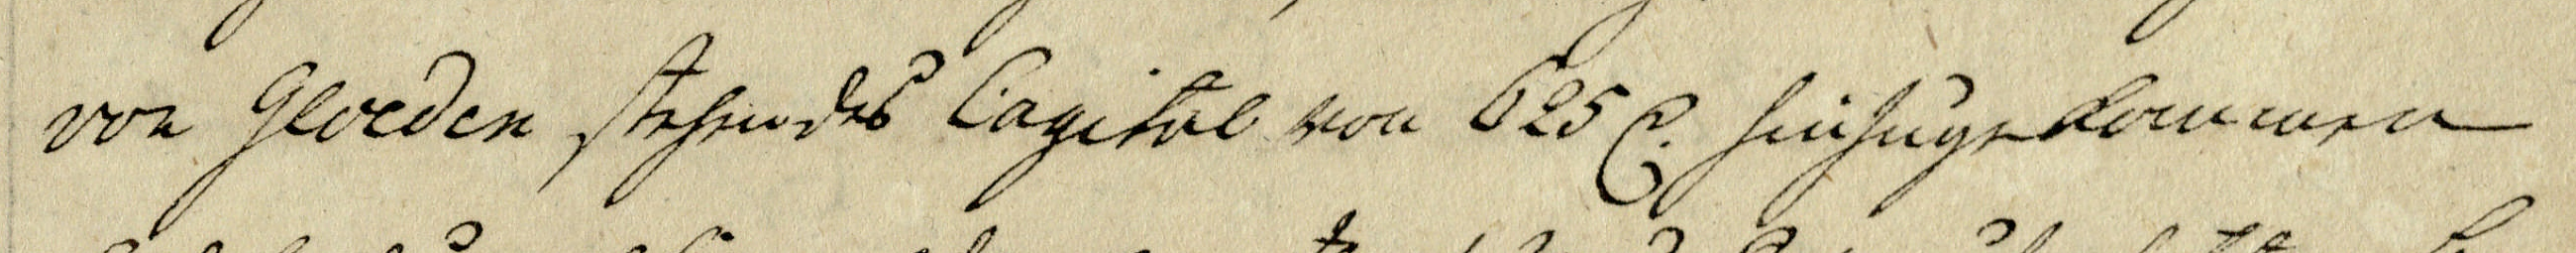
von Gloeden stehendes Capital von 625 l. hinzugekommen
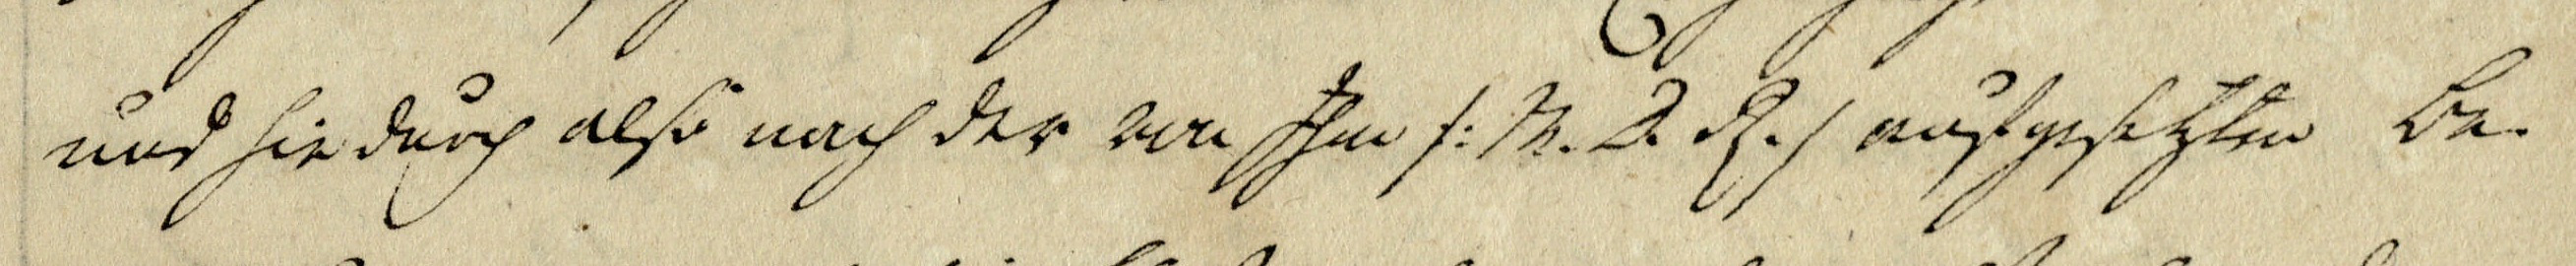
und hiedurch also nach der von Ihm /. M. D. R./ aufgesetzten Be¬
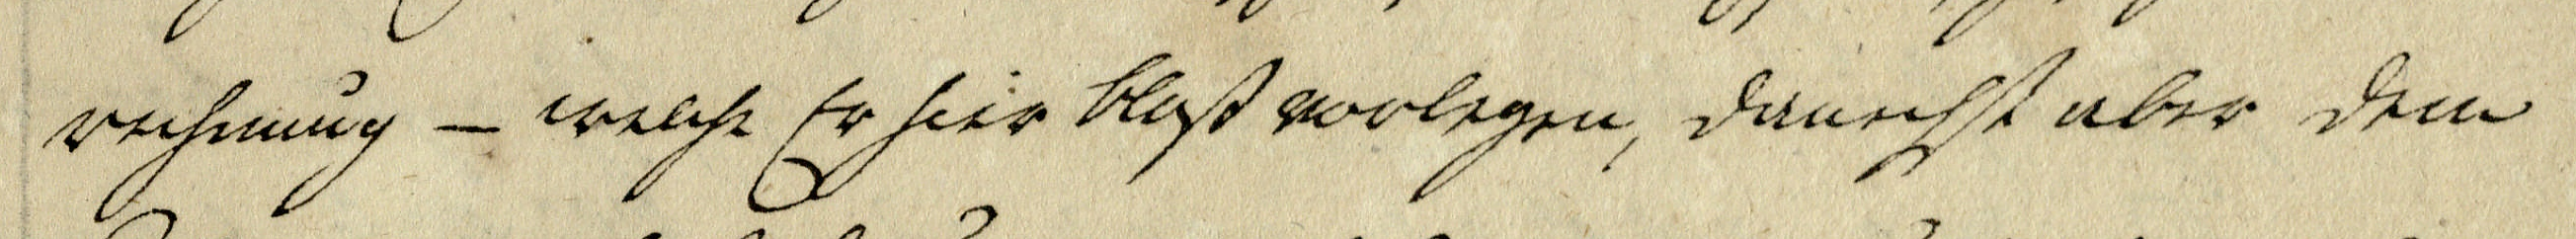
rechnung - welche Er hier bloß vorlegen, danechst aber dem
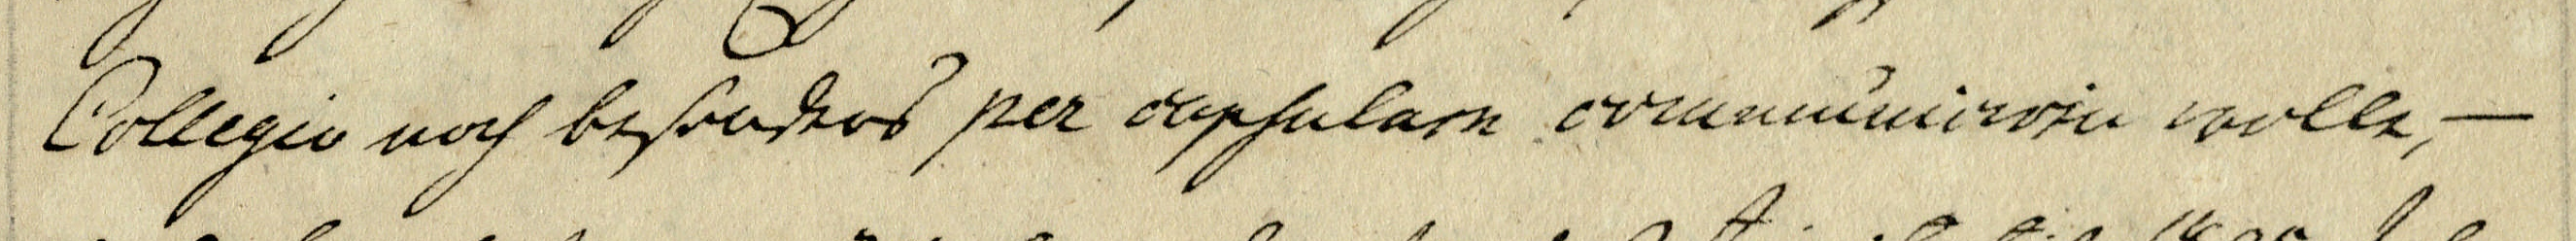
Collegio noch besonders per capsulam communiciren wolle, -
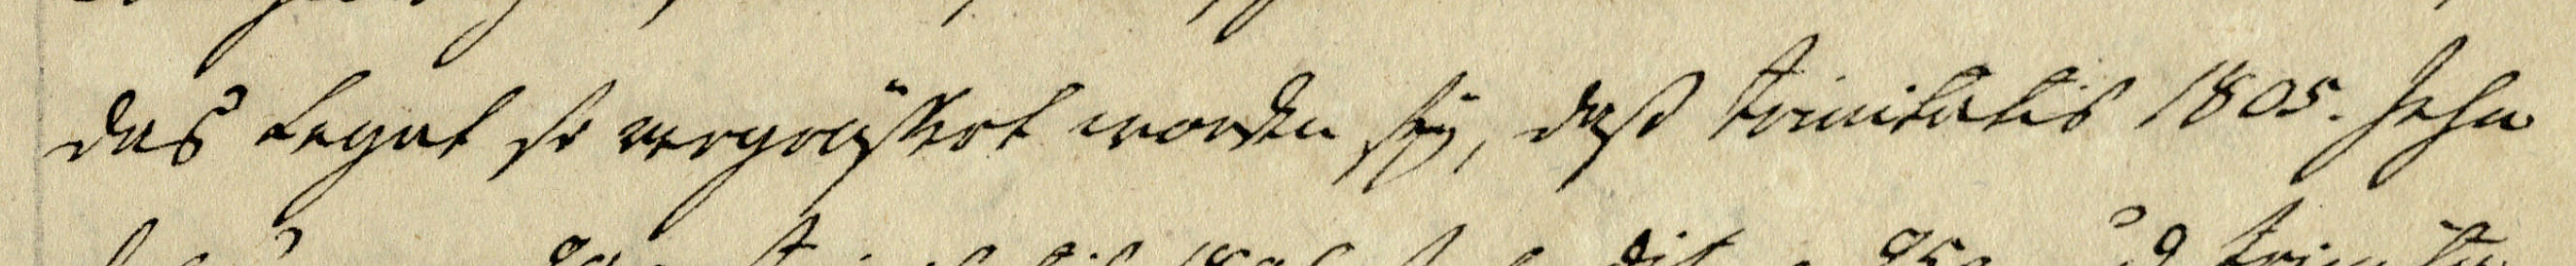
das Legat so vergrössert worden seÿ, daß Trinitatis 1805. Zehn
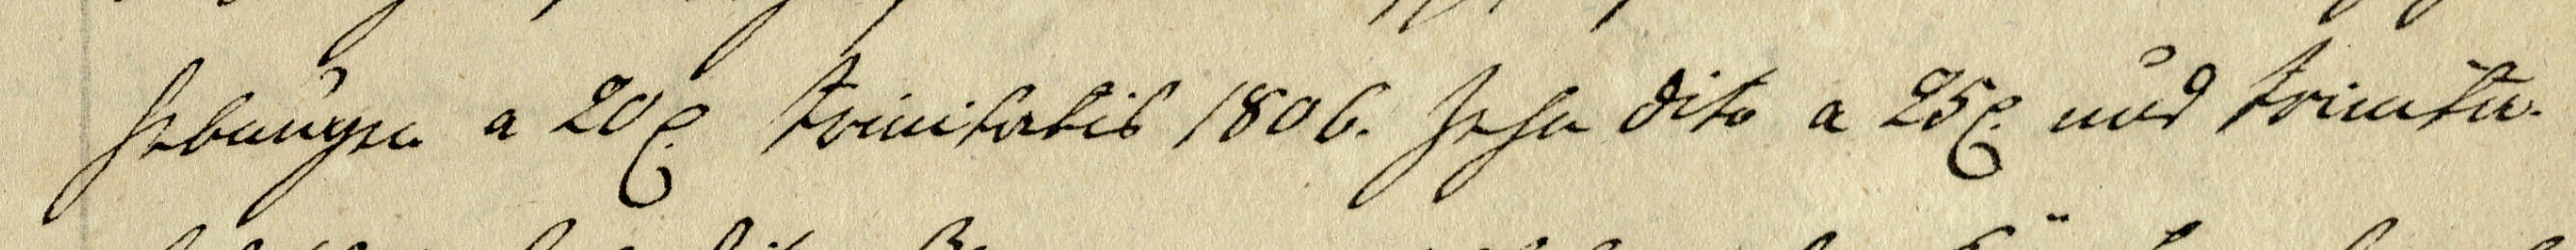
Hebungen a 20 l. Trinitatis 1806. Zehn dito a 25 l. und Trinita¬
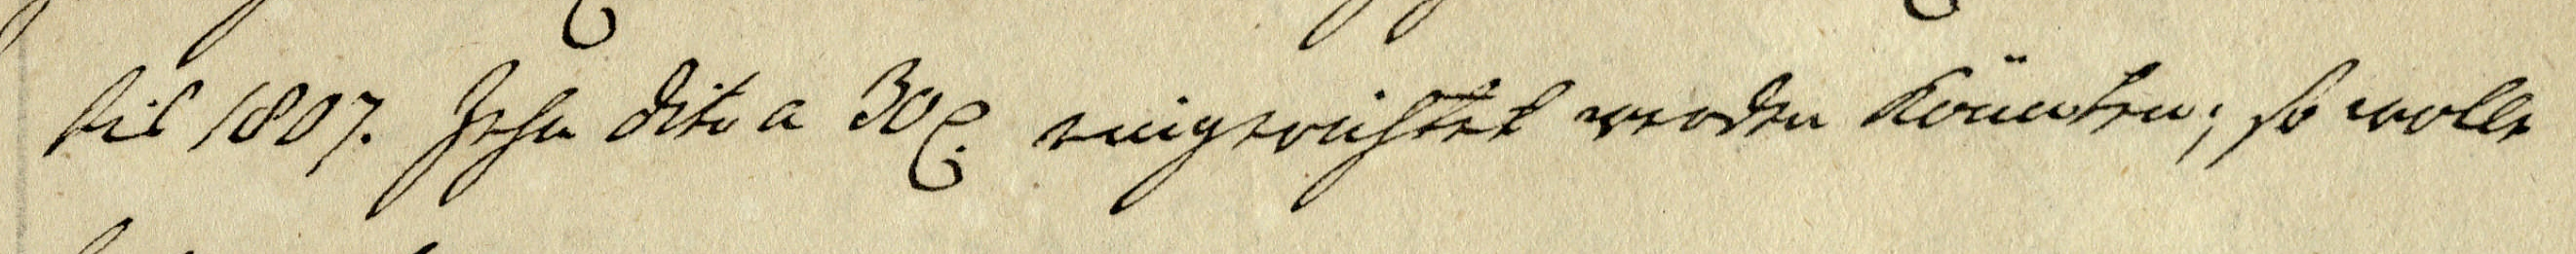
stis 1807. Zehn dito a. 30 l. eingerichtet werden könnten; so wolle
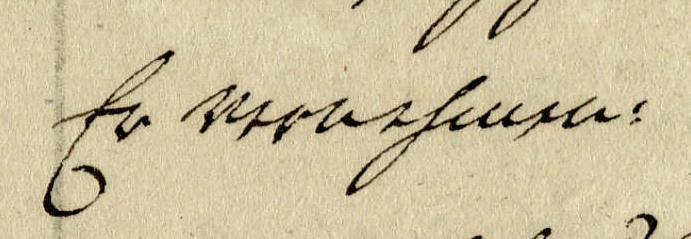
Er vernehmen:
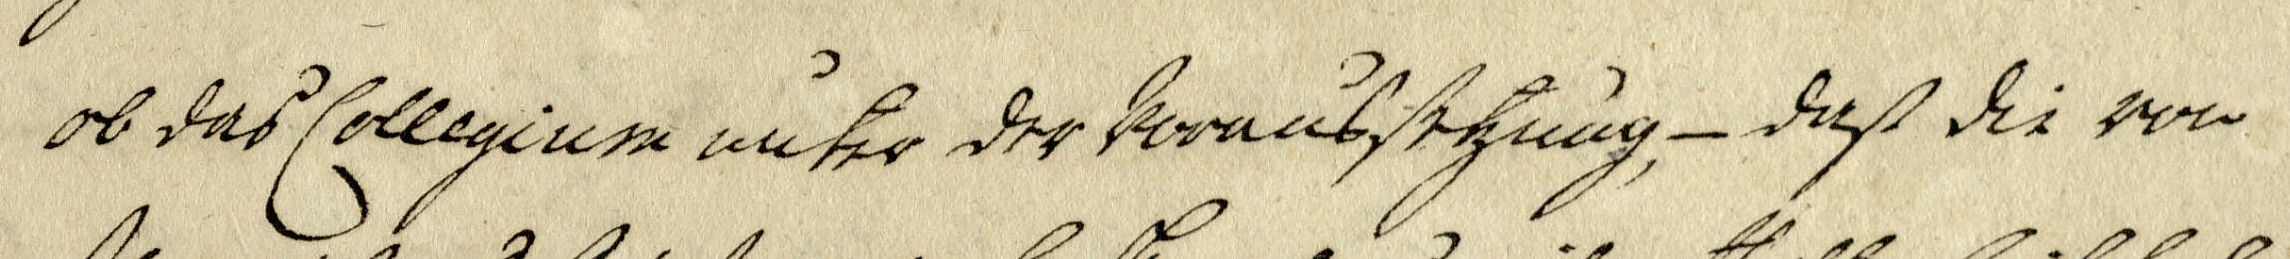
ob das Collegium unter der Voraussetzung, - daß die von
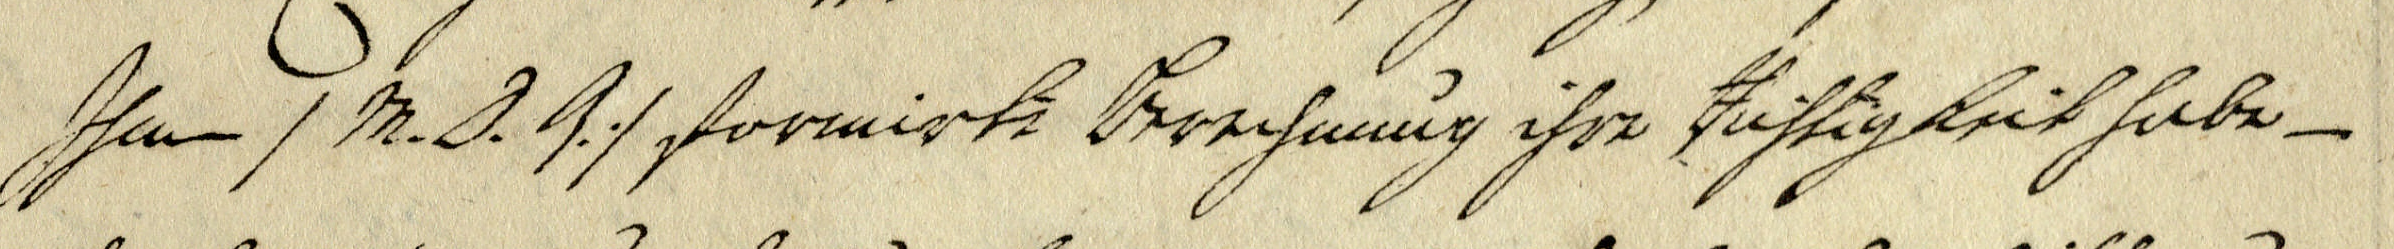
Ihm /M. D. R./ formirte Berechnung ihre Richtigkeit habe -
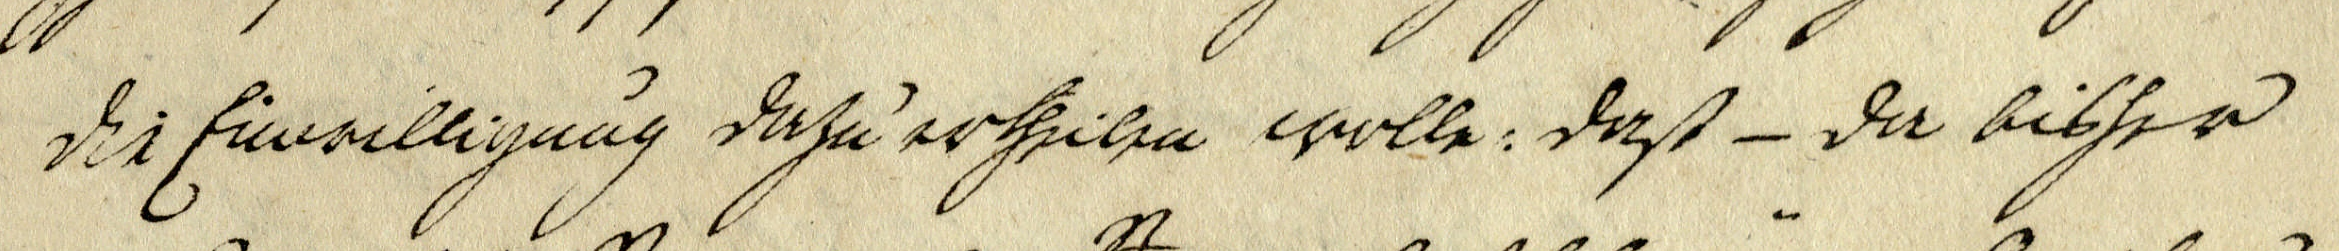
die Einwilligung dazu ertheilen wolle: daß - da bisher
